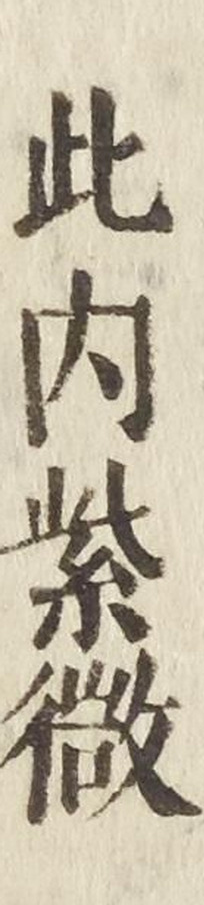此内紫微
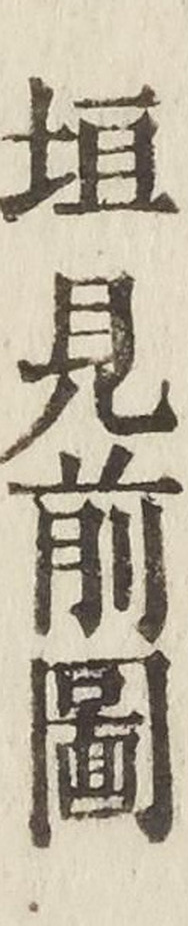垣見前図

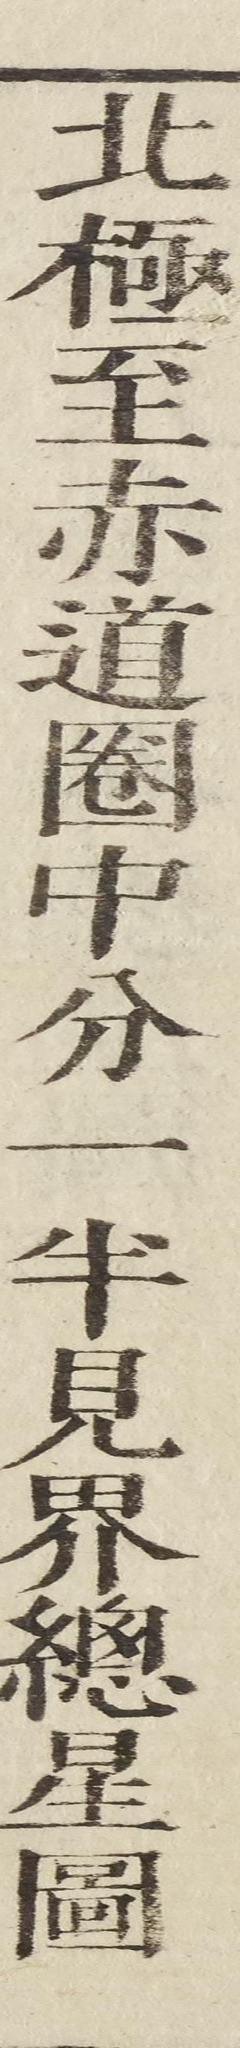北極至赤道圏中分一半見界総星図

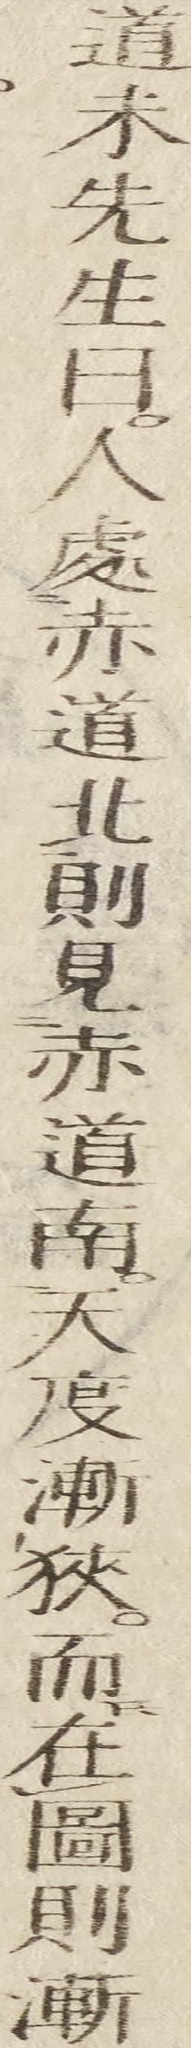道未先生曰。人処赤道北則見赤道南。天度漸ー狭。而在図則漸
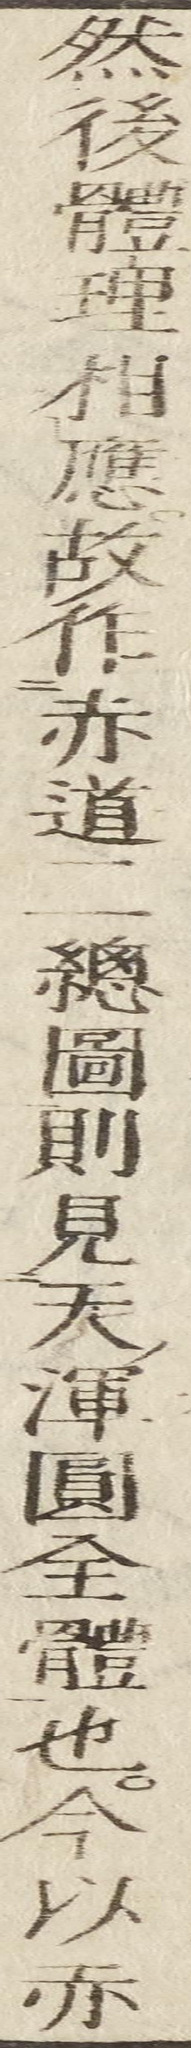然後体ー理相ー応。故作赤道二総図則見天渾円全体也。今以赤
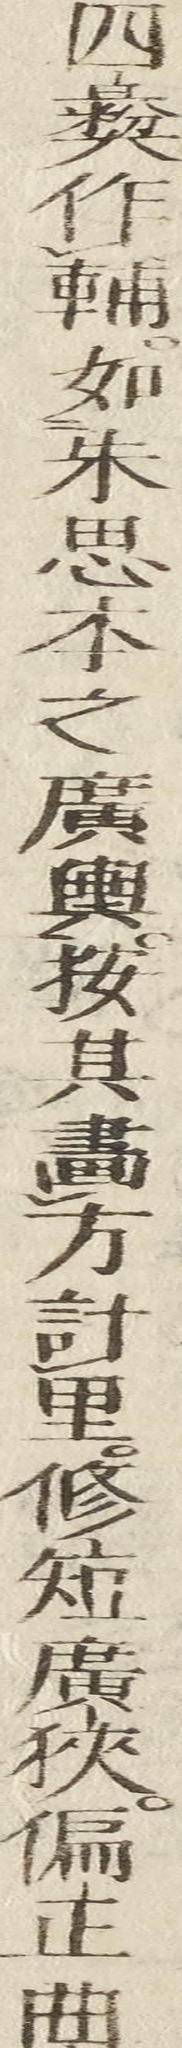四ー彝作輔。如朱思本之広輿。按其画方計里。修ー短広ー狭。偏ー正曲ー
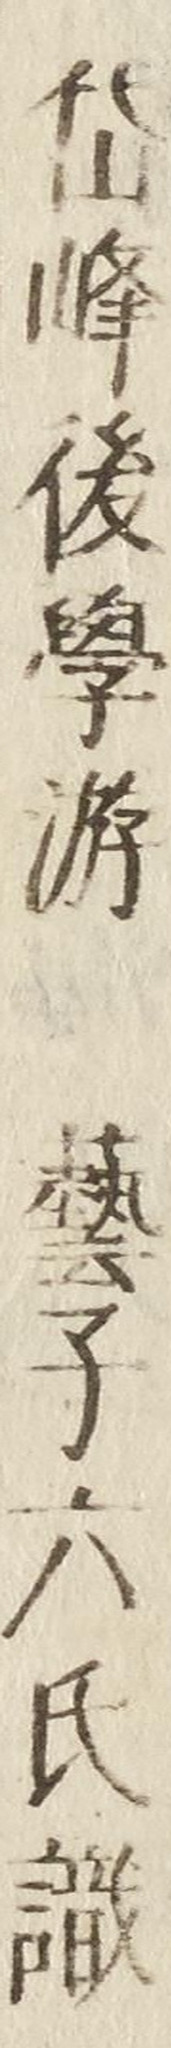岱峰後学游芸子六氏識
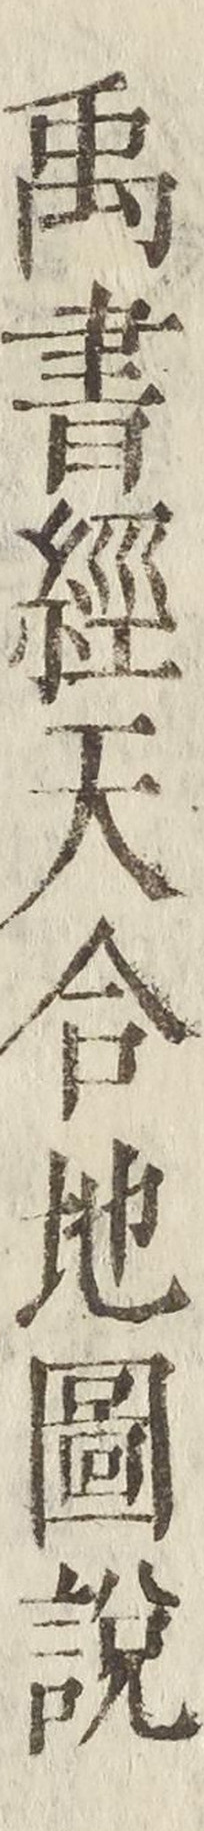禹書経天合地図説
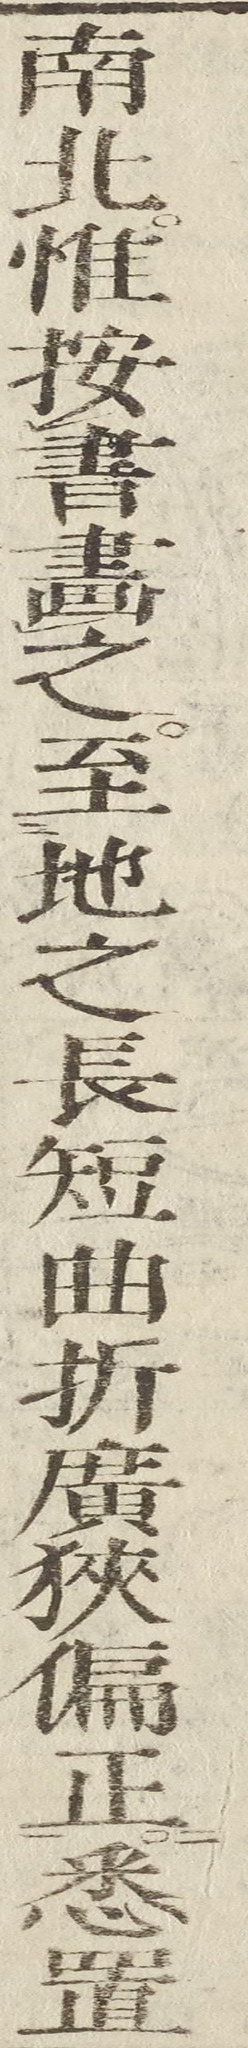南北。惟按書画之。至地之長短曲折広狭偏正。悉置
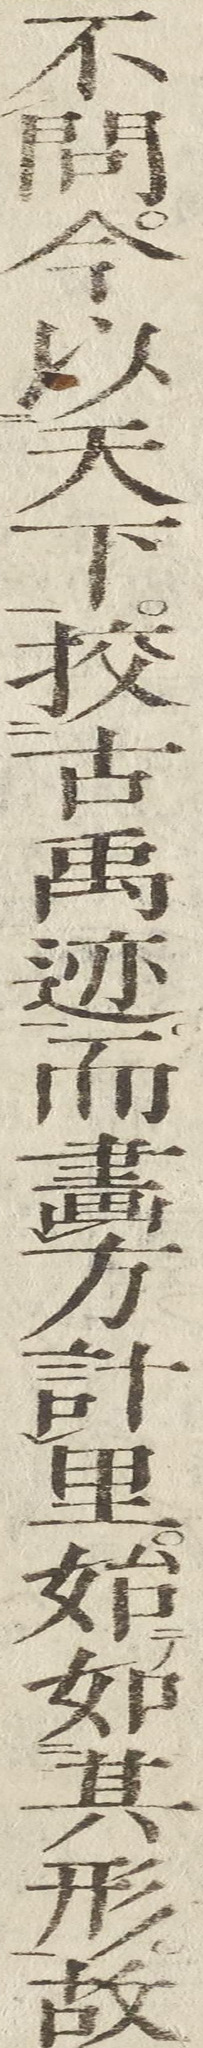不問。今以天下。挍古禹迹。而画方計里。始如其形。故
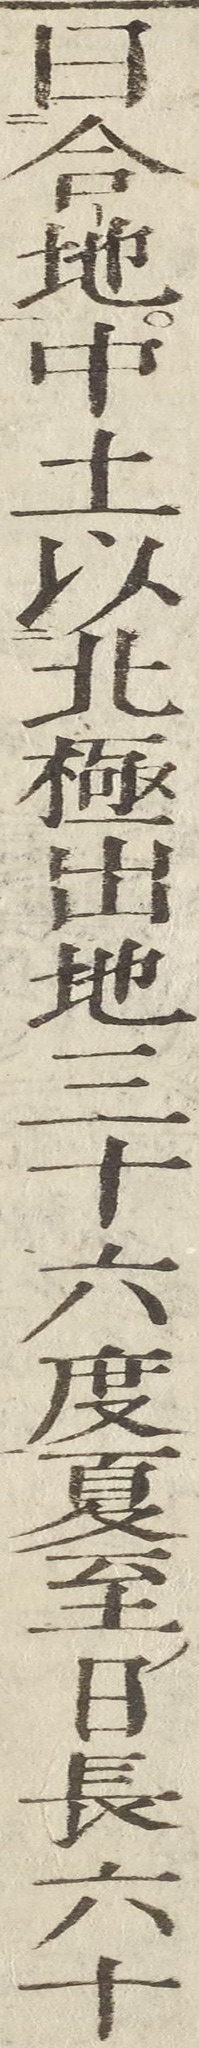曰合ー地。中土以北極出地三十六度夏至日長六十
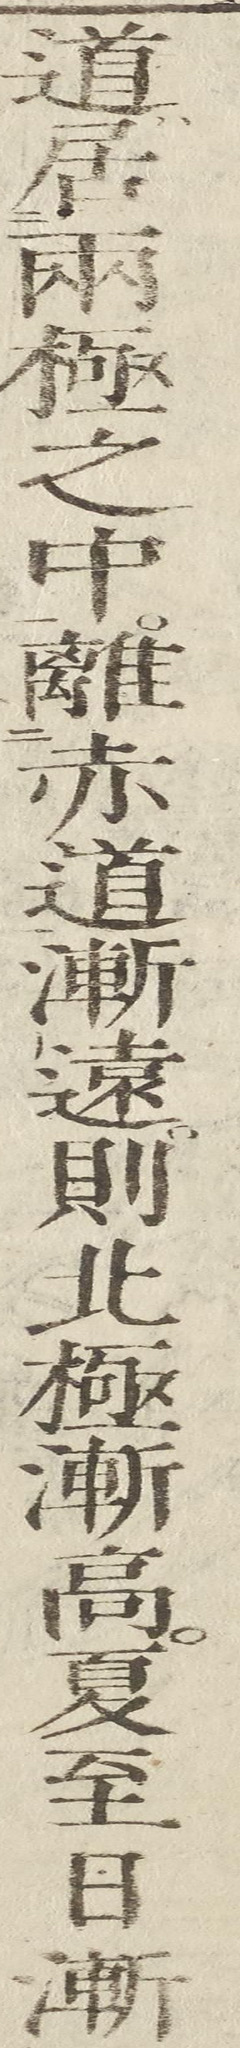道居両極之中。離赤道漸ー遠。則北極漸高。夏至日漸

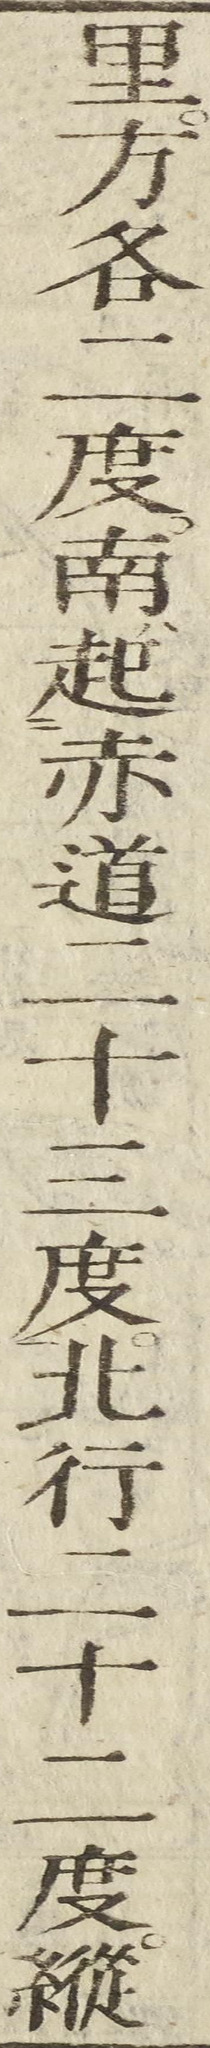里。方各二度。南起赤道二十三度。北行二十二度。縦
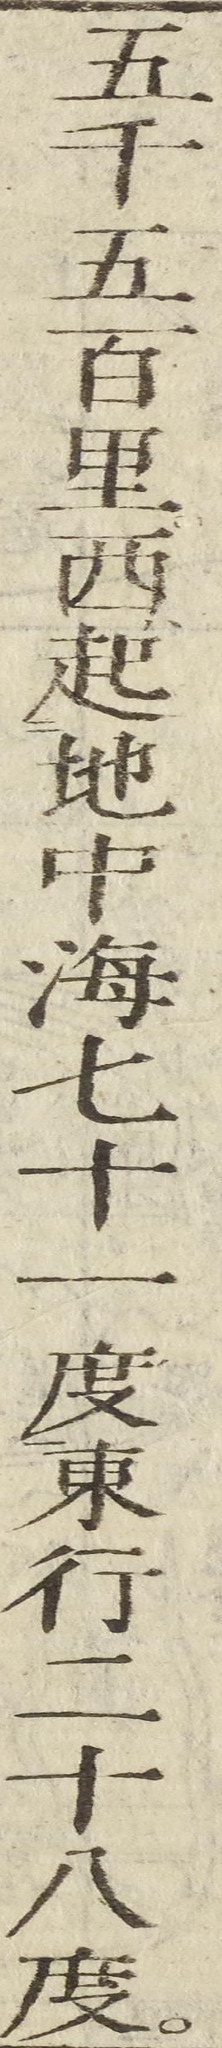五千五百里。西起地中海七十一度東行二十八度。
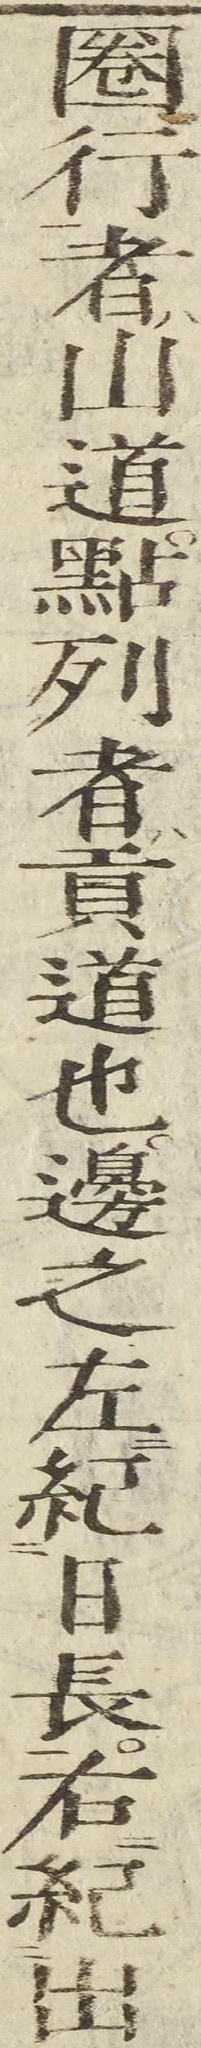圏行者山道。点列者貢道也。辺之左紀日長。右紀出
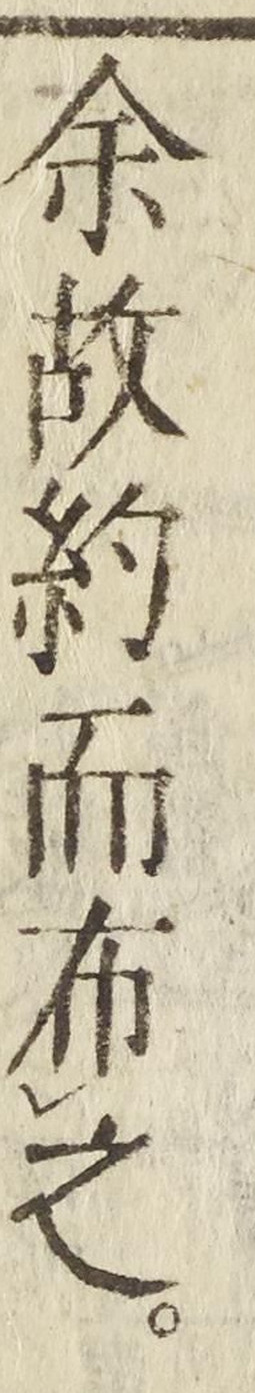余故約而布之。
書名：天經或問　序圖
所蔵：東京大学地震研究所図書室 Earthquake Research Institute Library, The University of Tokyo, JAPAN
